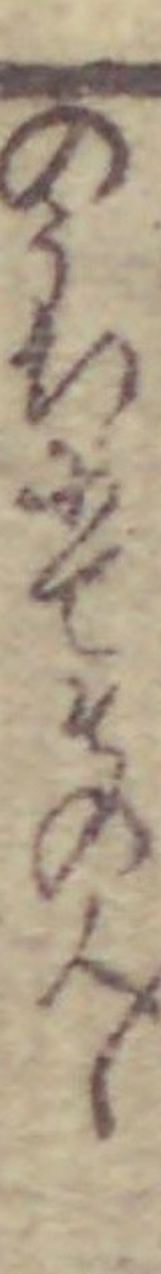のうちにてその人〳〵
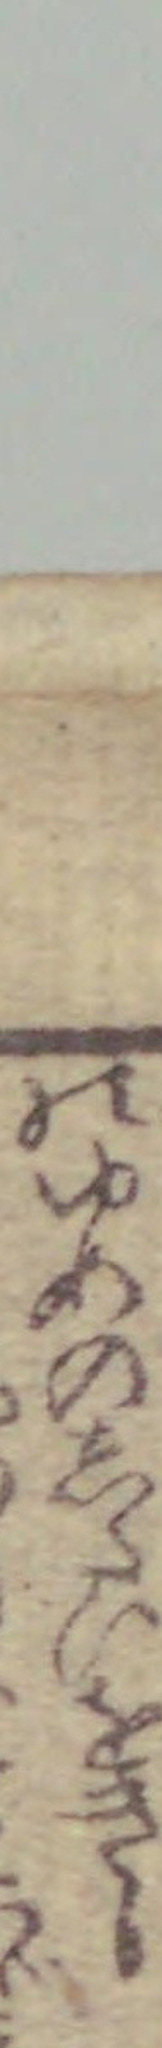のゆめのしたいをきゝ
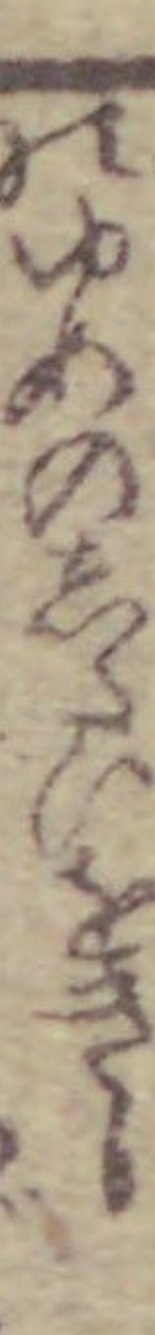のゆめのしたいをきゝ
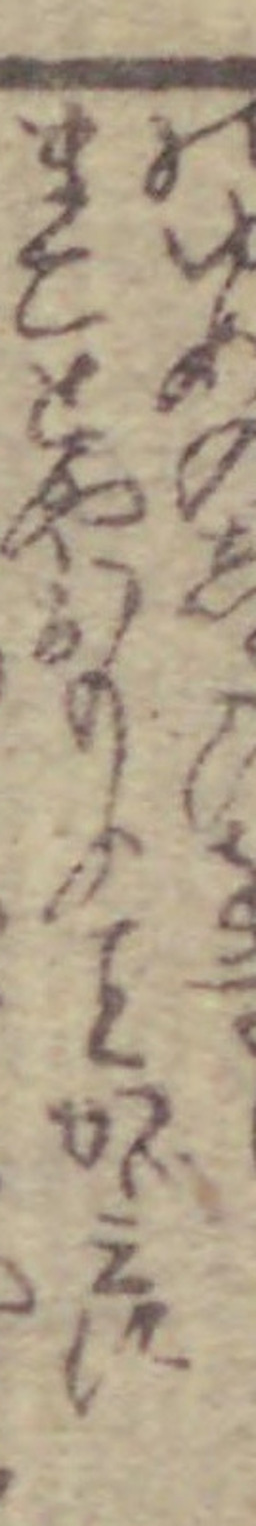まことやおもふことかゞみに
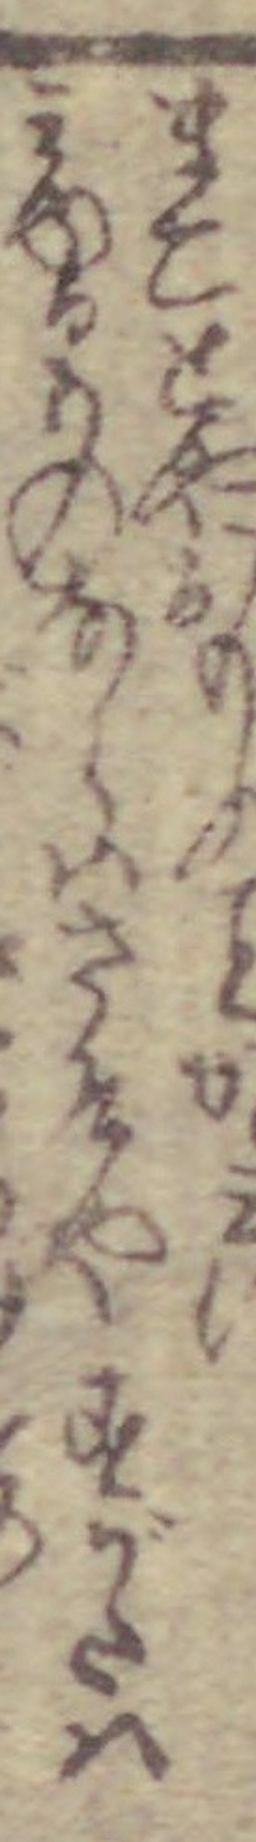みゆるものならはさそやすがたは
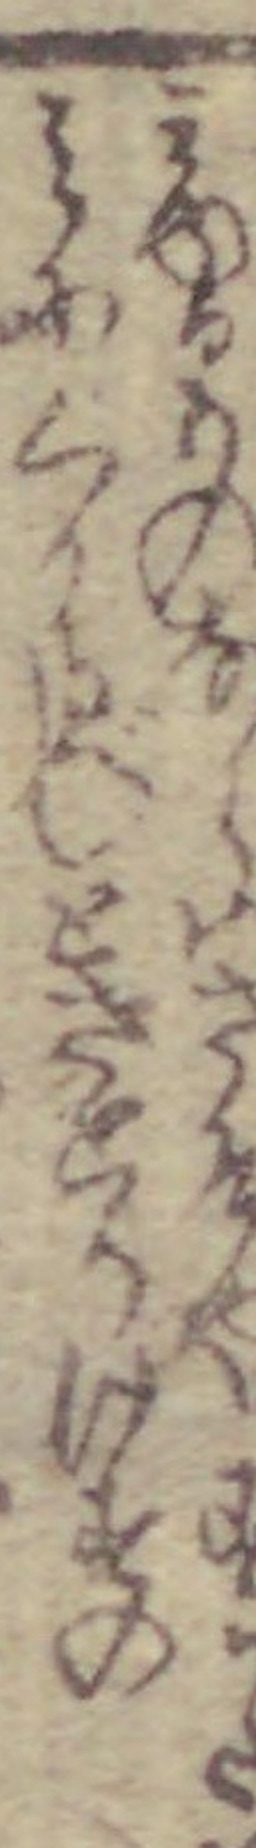みにくかるべしとさとりけすの
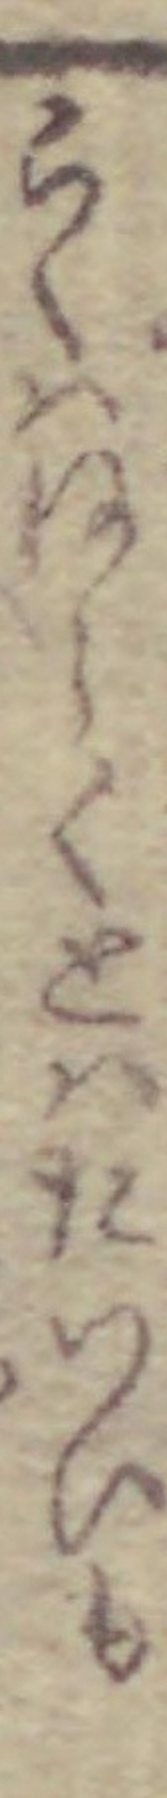らくはねらくとはたついも
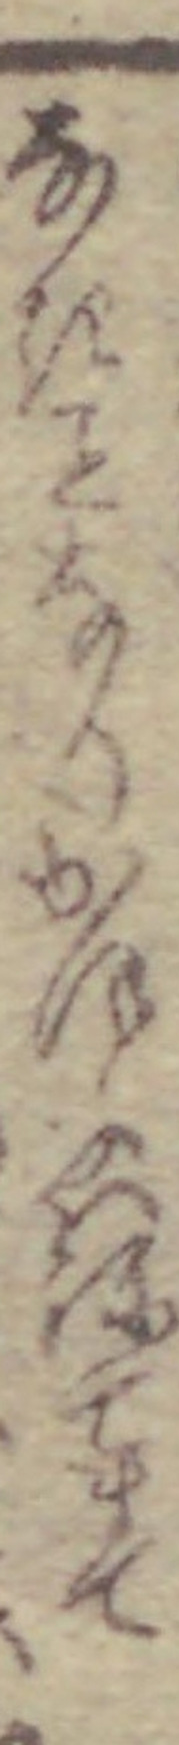なきことなりかほふはねてまて
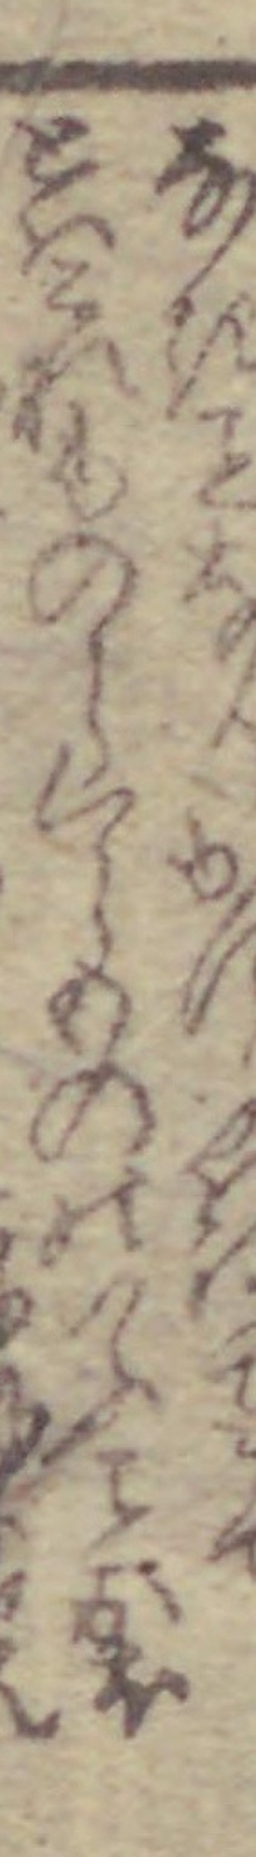とはこれものらくらもののいふことかほ
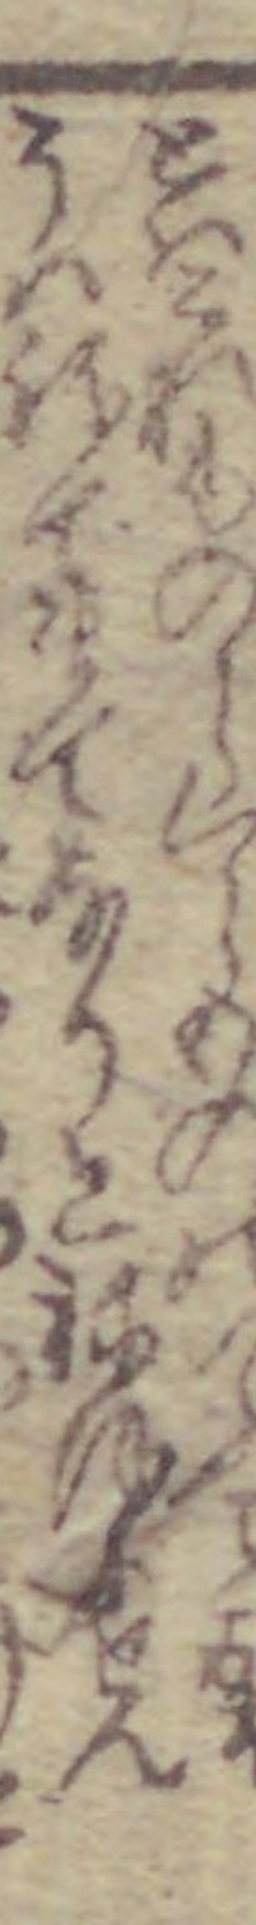うはねでまてなりとねほふせん
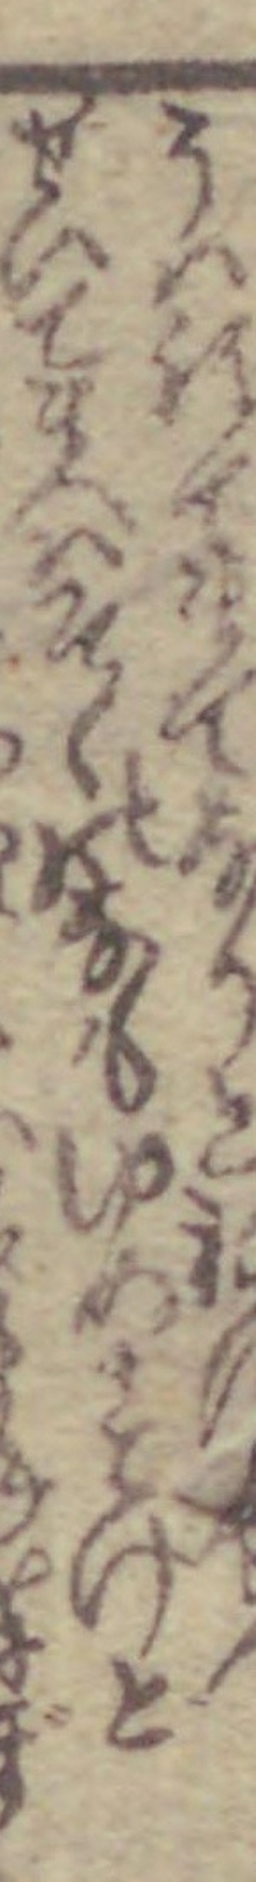せいてまへはそくのなもゆめすけと
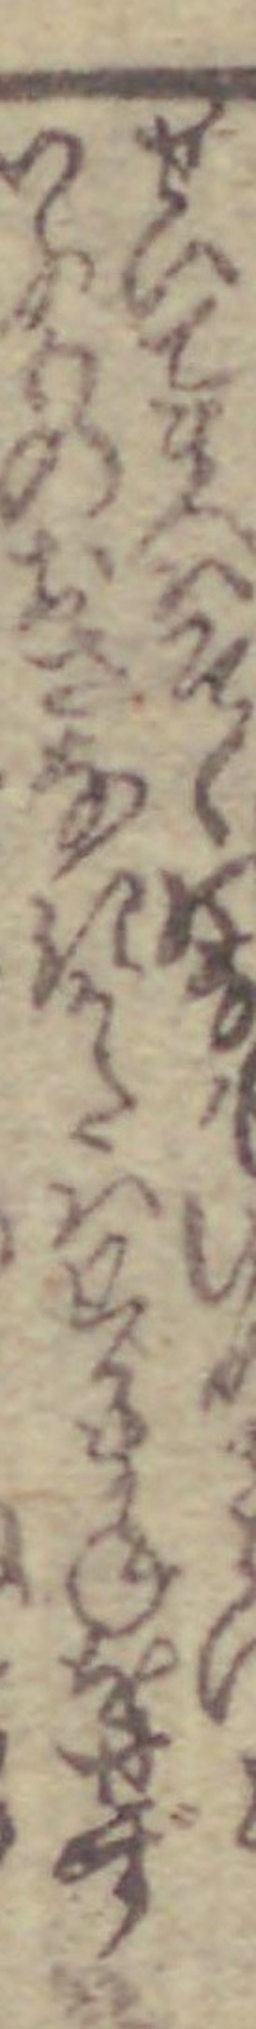いふものおさなきかたはわがまねをせず
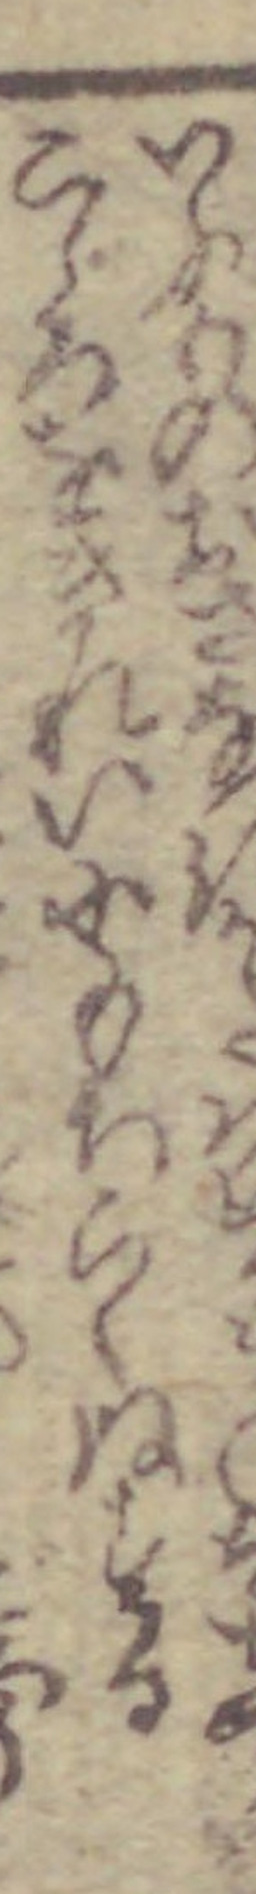こゝろをきれいにもちらくねする
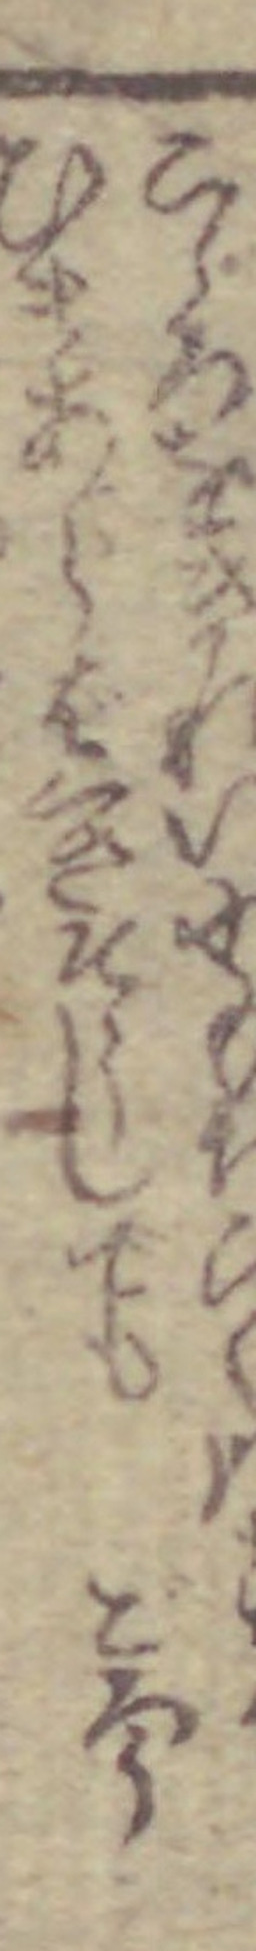ひまあらばくさそうしでもごろう
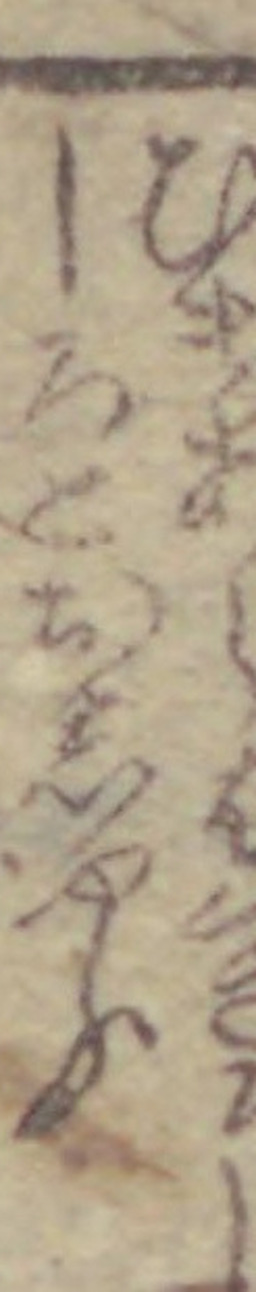しろとおしやふ
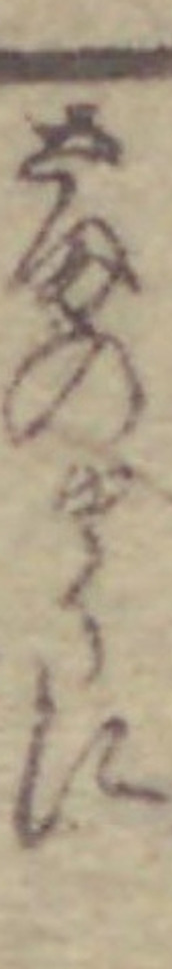さまのやうに
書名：思事夢濃枕 3巻
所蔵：国立国会図書館 National Diet Library, JAPAN
